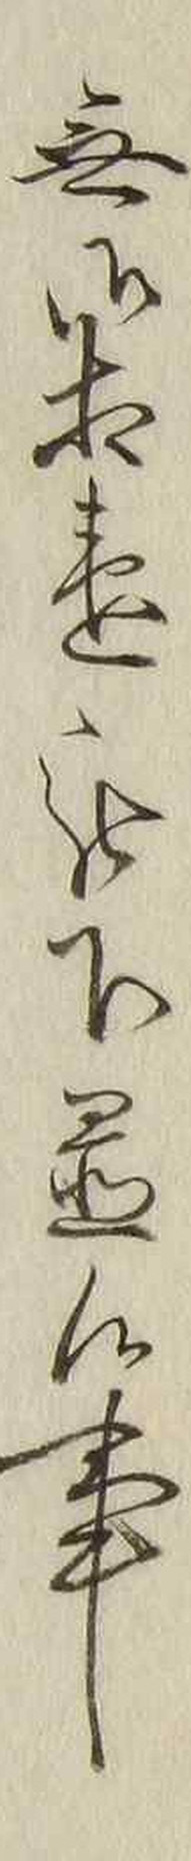無相違被下置候事
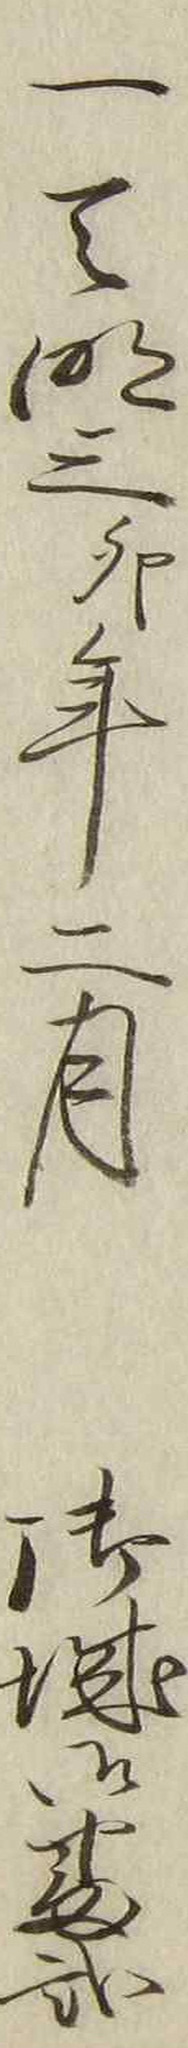一天明三卯年二月御城御番弐

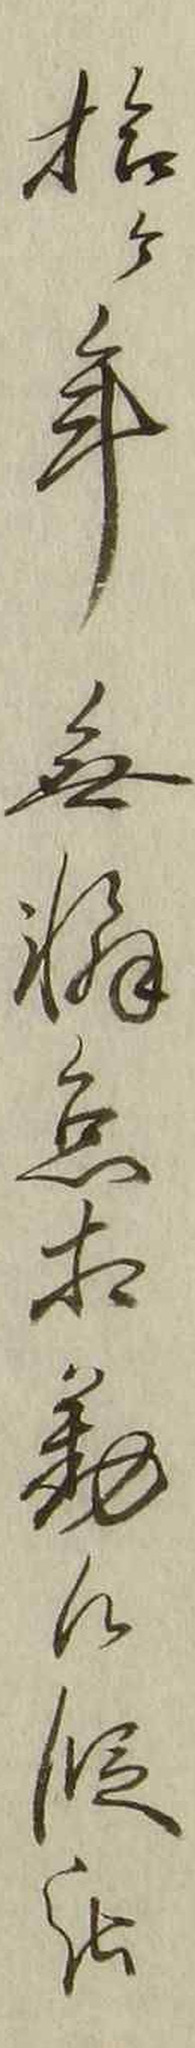拾ヶ年無懈怠相勤候段被
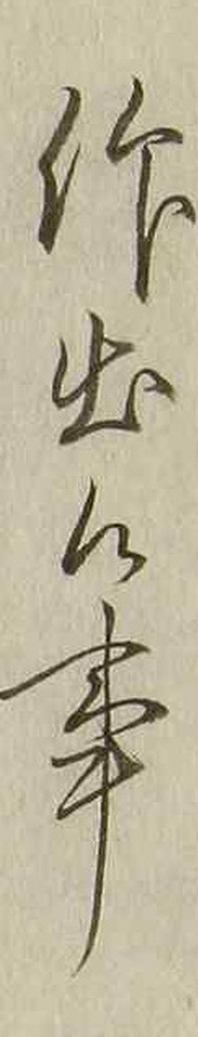仰出候事
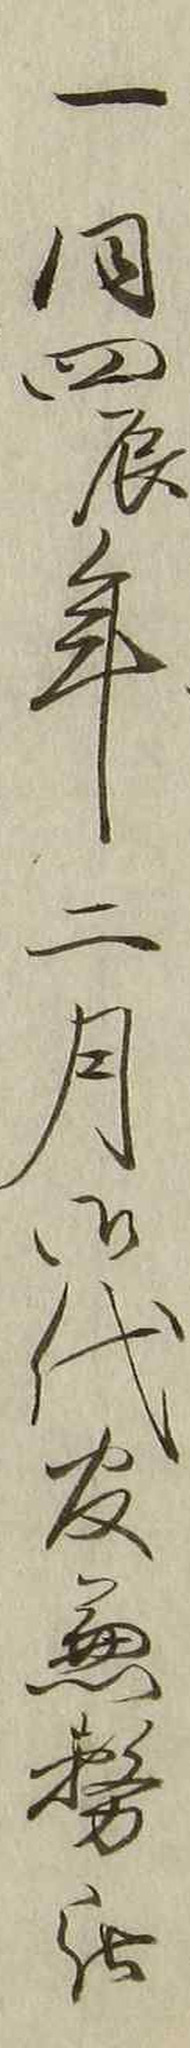一同四辰年二月御代官兼務被
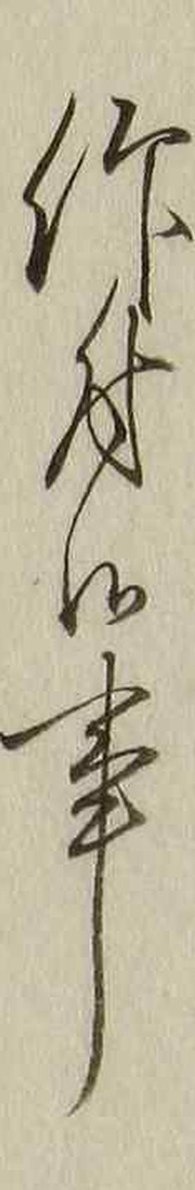仰付候事
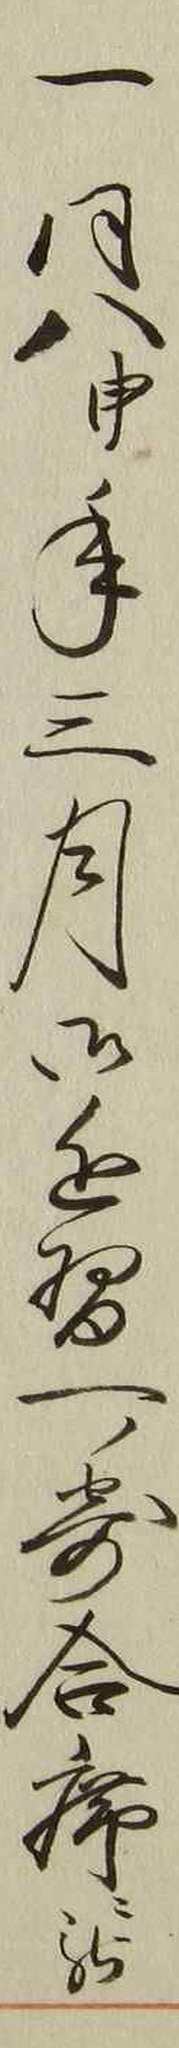一同八申年三月御近習一ノ寄合席ニ被
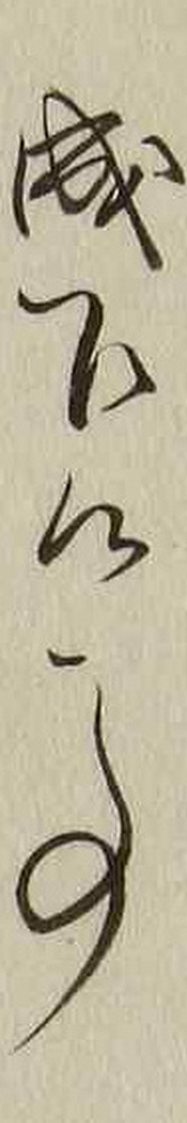成下候事
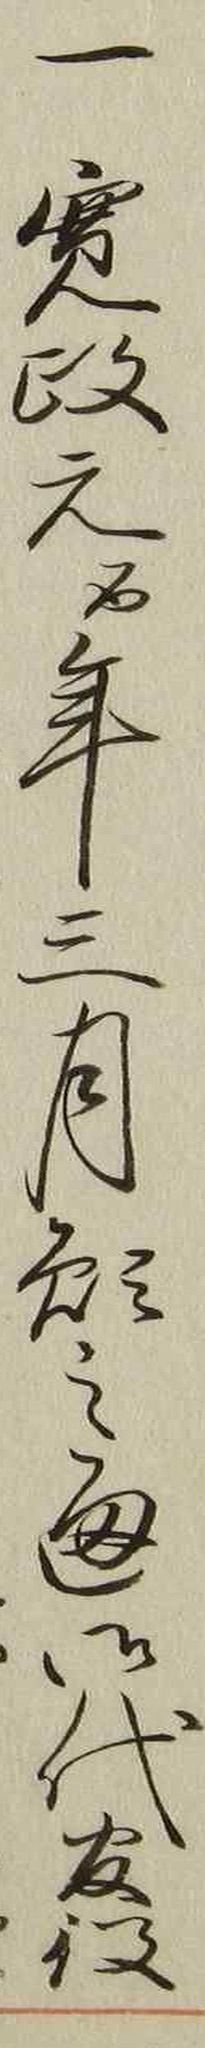一寛政元酉年三月願之通御代官役
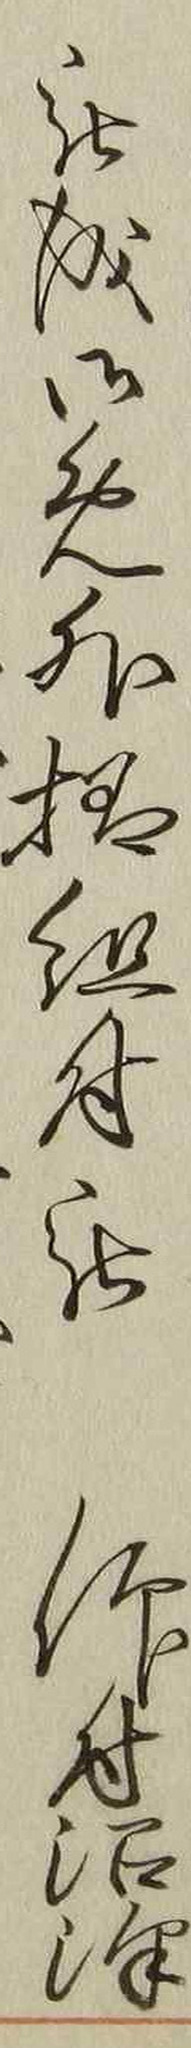被成御免外様組被仰付沼沢
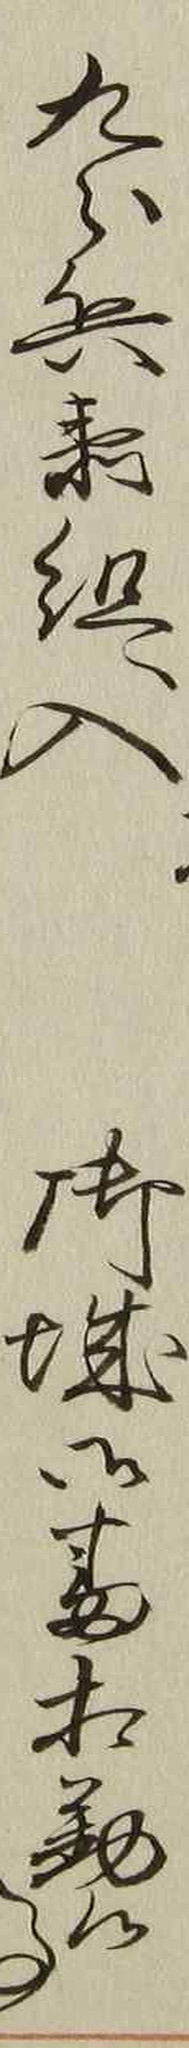九郎兵衛組へ入御城御番相勤候事
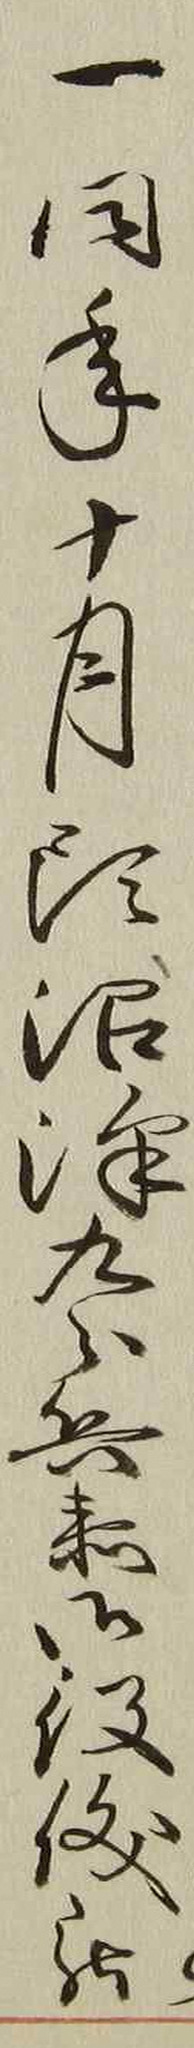一同年十月頭沼沢九郎兵衛御役儀被
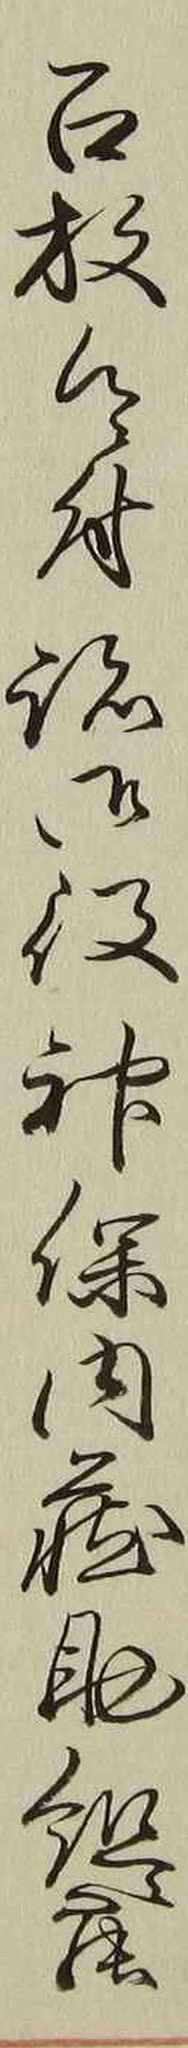召放候ニ付跡御役神保内蔵助組ニ罷
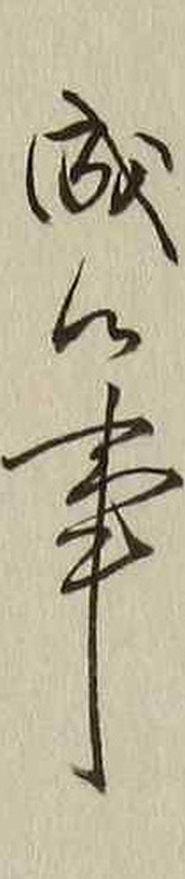成候事
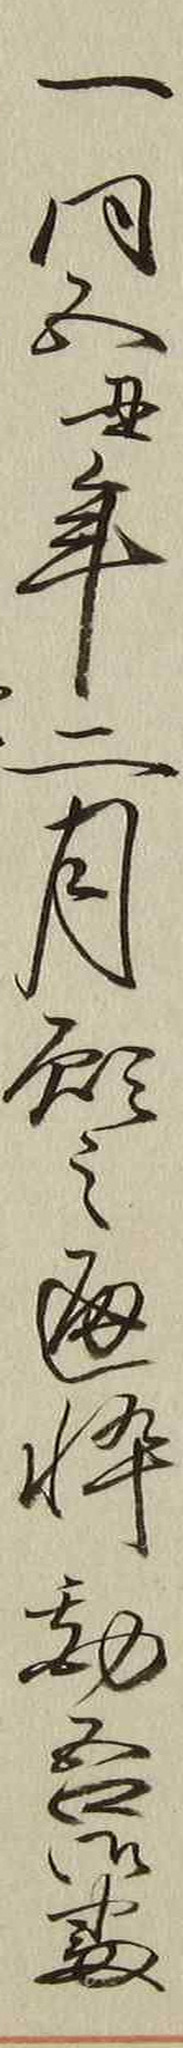一同五丑年二月願之通忰勘吾御番
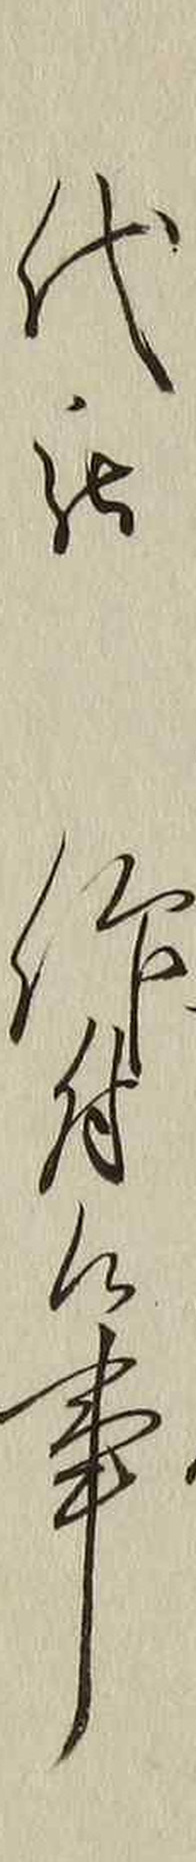代被仰付候事
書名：諸士系譜　巻之54　ほ之部1
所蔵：会津若松市立会津図書館
